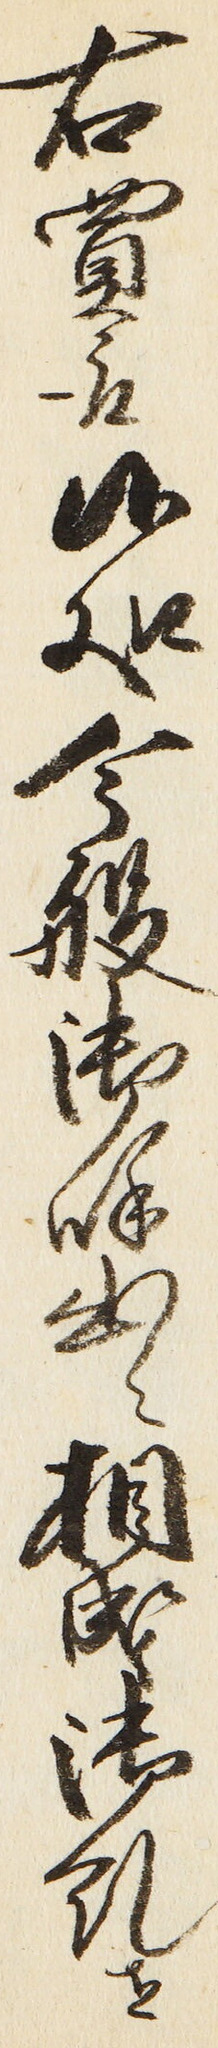右買取候処今般御呼出ニ相成御糺を
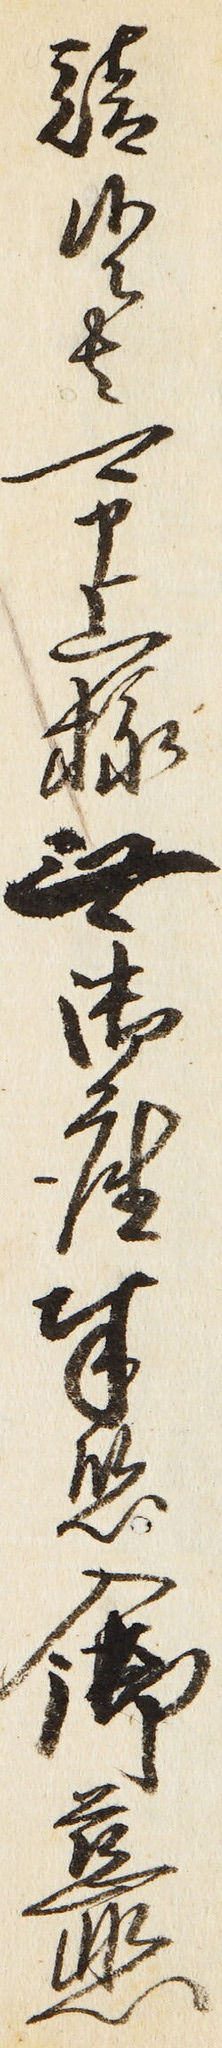請候ニ者可申上様無御座奉恐入御慈悲
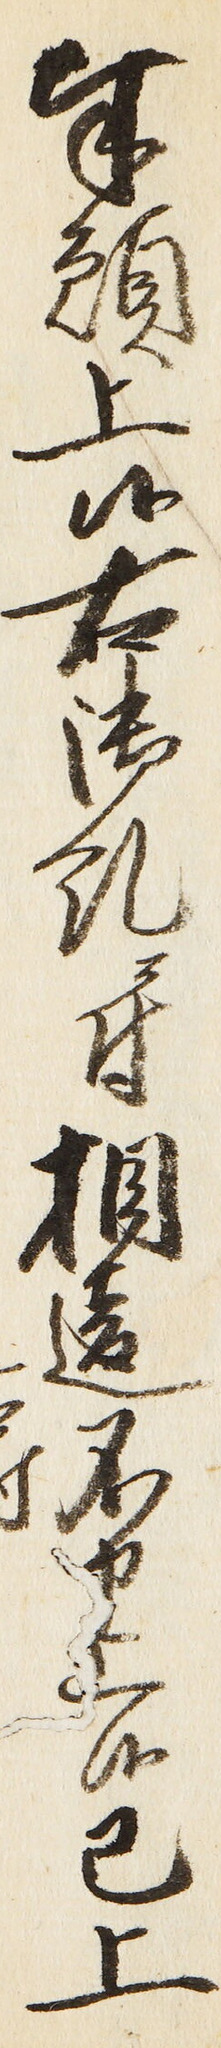奉願上候右御糺ニ付相違不申上候已上
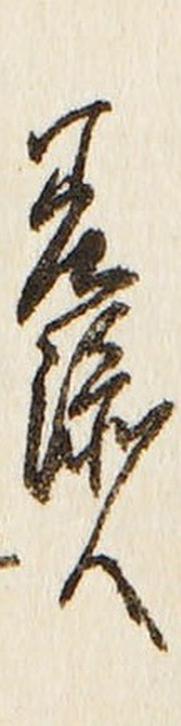差添人
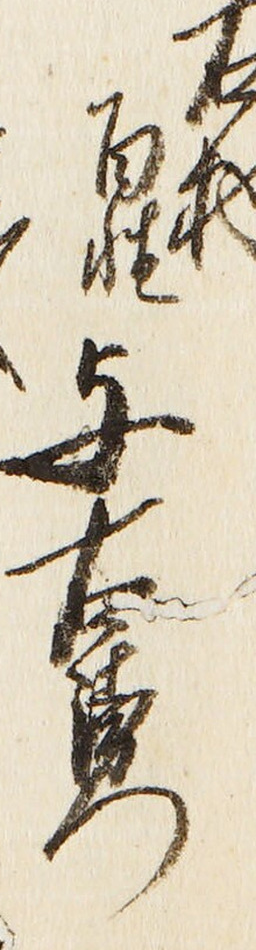直右衛門
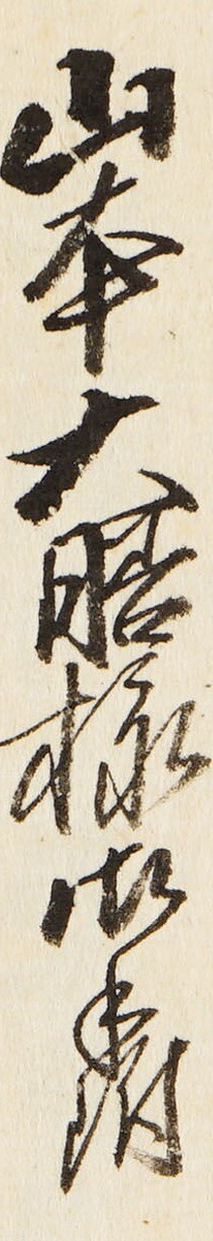山本大膳様御手付
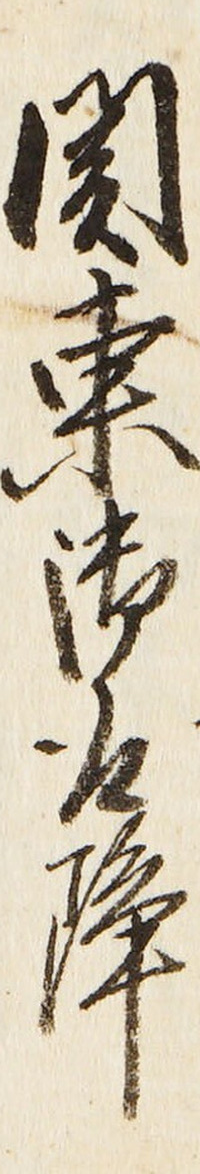関東御取障
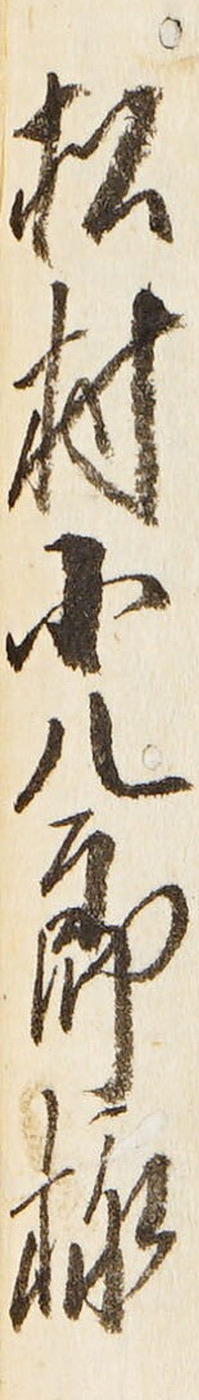松村小八郎様
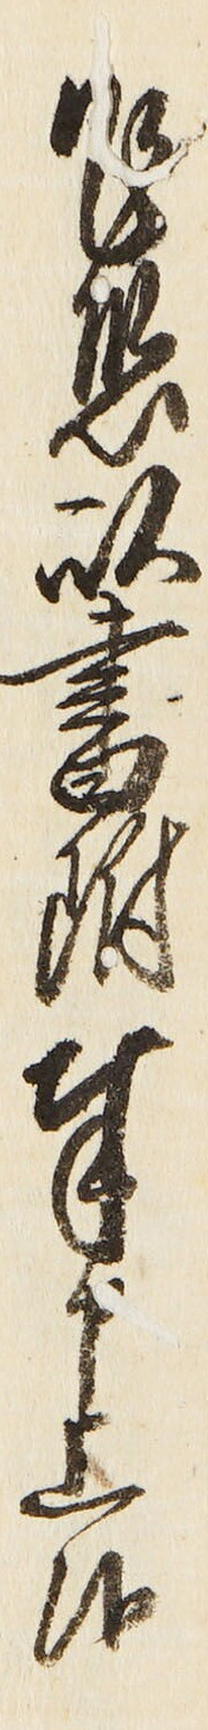乍恐以書付奉申上候
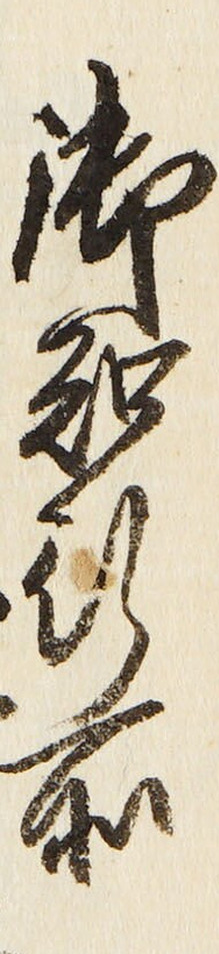御知行所
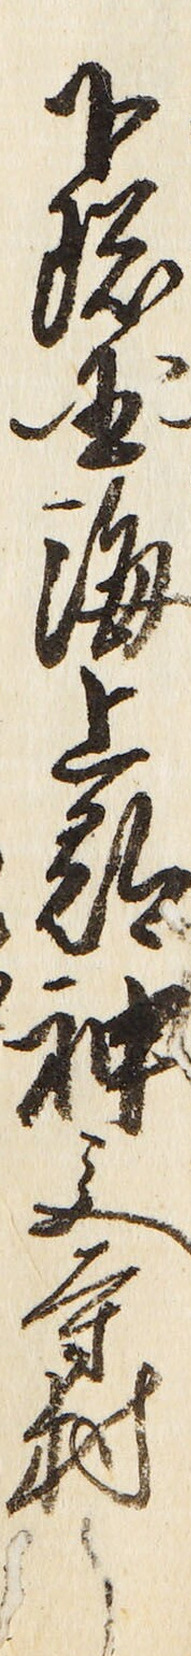下総国海上郡神宮寺村
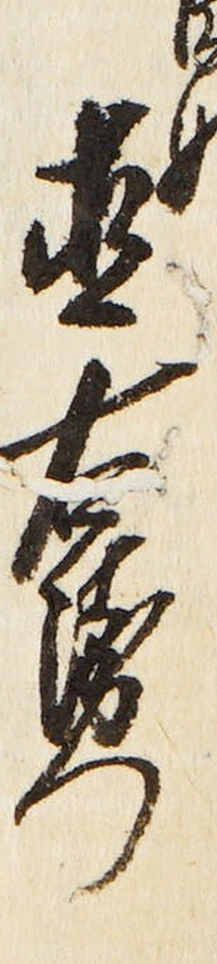直右衛門
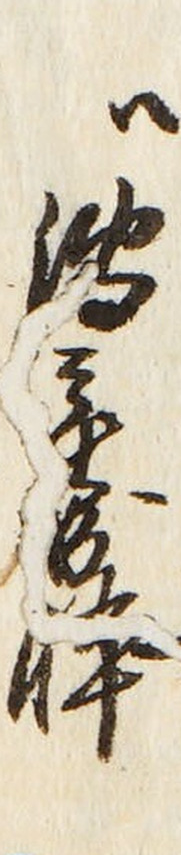同伝兵衛忰
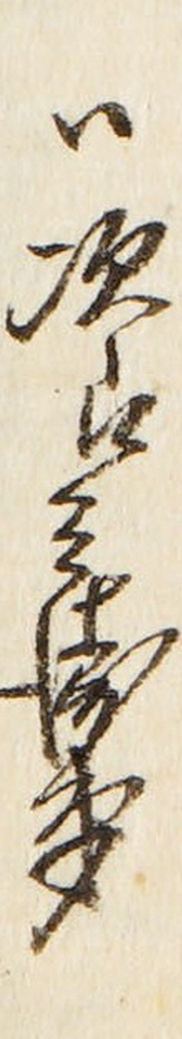同治郎兵衛弟
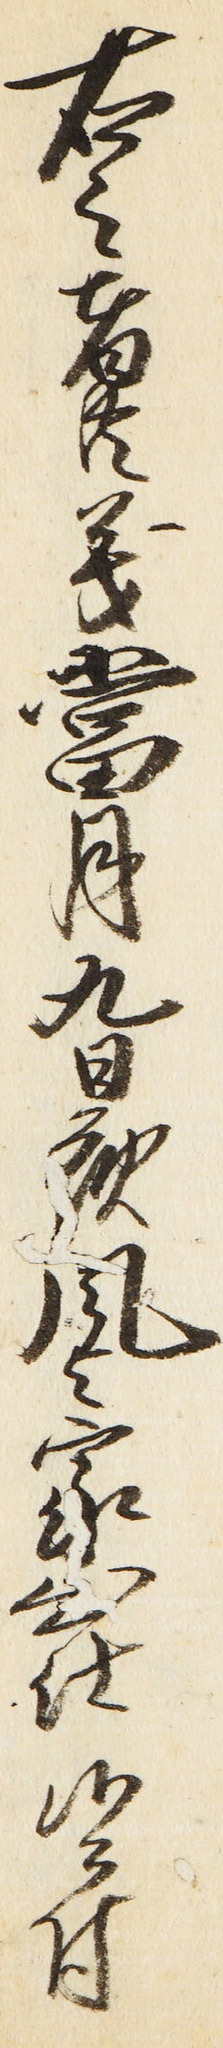右之者共義当月九日夜風与家出仕候ニ付

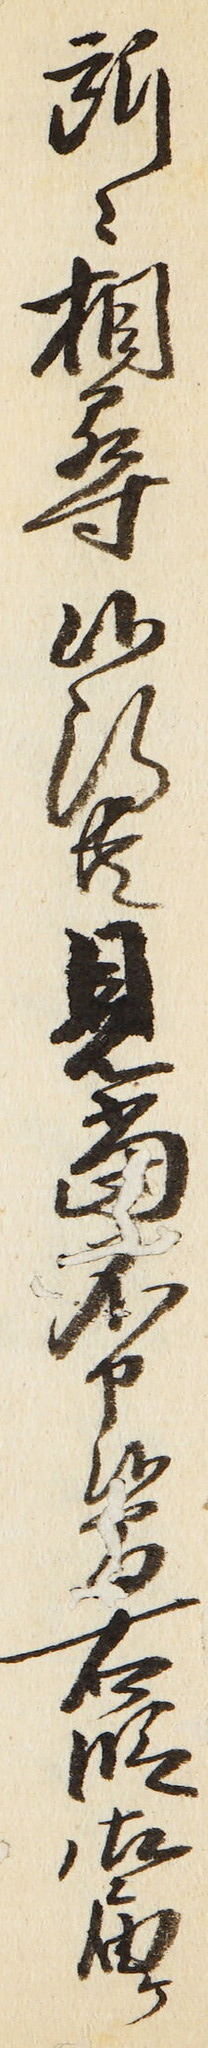所々相尋候得共見当不申候間右段御届ケ
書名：難船一件記録
